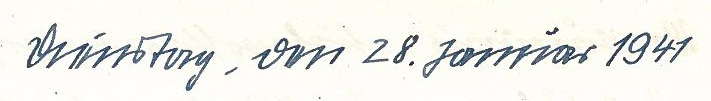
Dienstag, den 28. Januar 1941
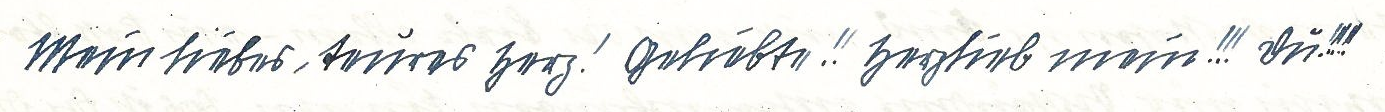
Mein liebes teures Herz! Herzlieb mein!!! Du!!!!
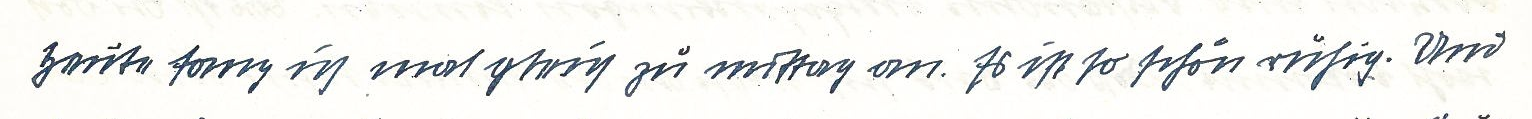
Heute fang ich mal gleich zu mittag an. Es ist so schön ruhig. Und
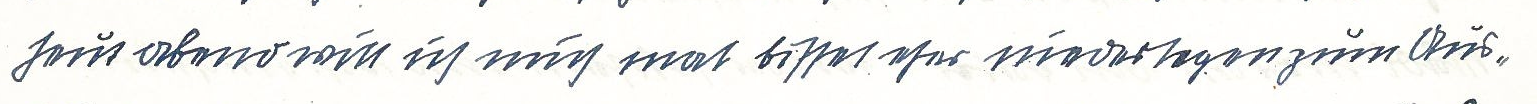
heut abend will ich mich mal bissel eher niederlegen zum Aus¬
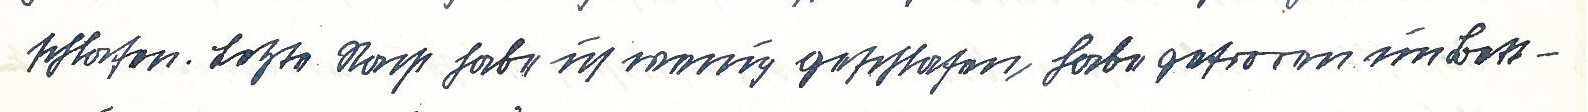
schlafen. Letzte Nacht habe ich wenig geschlafen, habe gefroren im Bett –
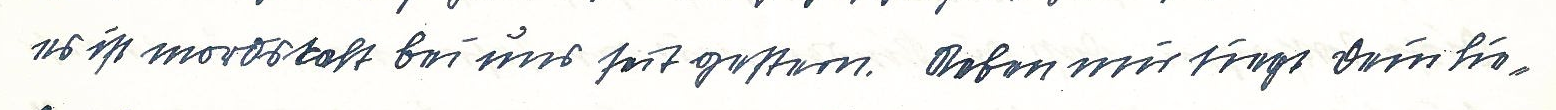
es ist mordskalt bei uns seit gestern. Neben mir liegt Dein lie¬
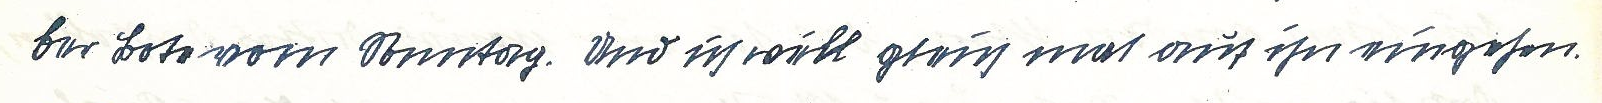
ber Bote vom Sonntag. Und ich will gleich mal auf ihn eingehen.
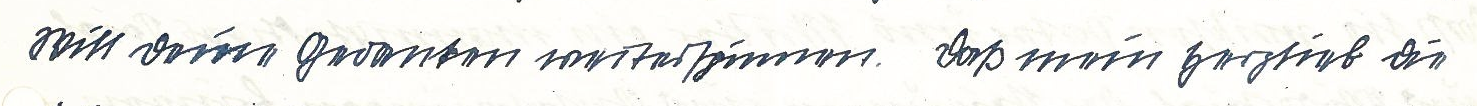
Will Deine Gedanken weiterspinnen. Daß mein Herzlieb die
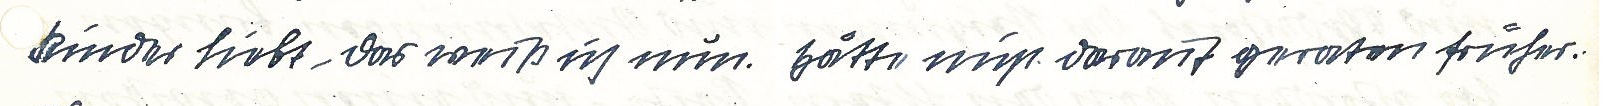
Kinder liebt, das weiß ich nun. Hätte nicht darauf geraten früher.
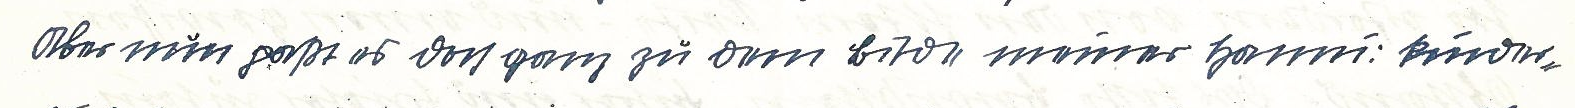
Aber nun paßt es doch ganz zu dem Bilde meiner Hilde: kinder¬
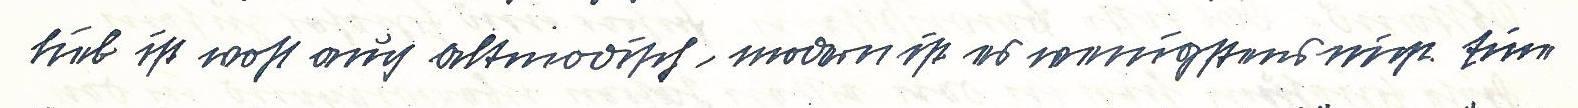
lieb ist wohl auch altmodisch, modern ist es wenigstens nicht. Eine
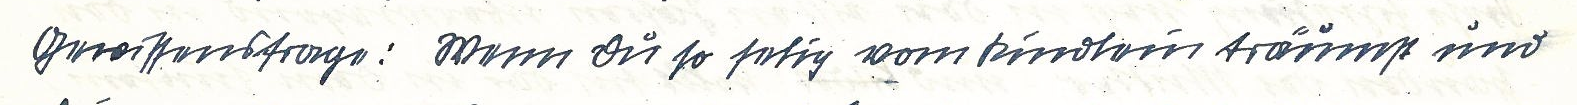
Gewissensfrage: Wenn Du so selig vom Kindlein träumst und
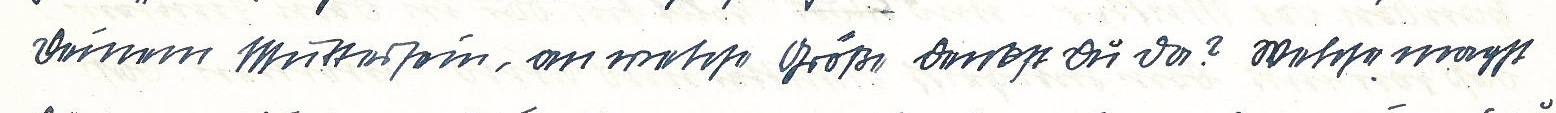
Deinem Muttersein, an welche Größe denkst Du da? Welche magst
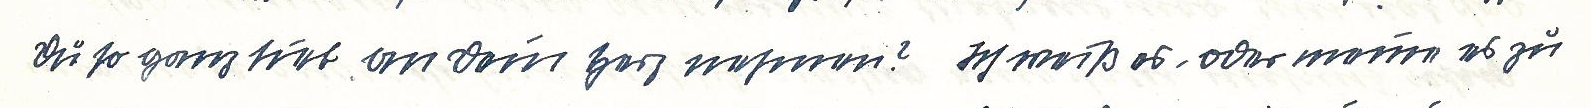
Du so ganz lieb an Dein Herz nehmen? Ich weiß es, oder meine es zu
